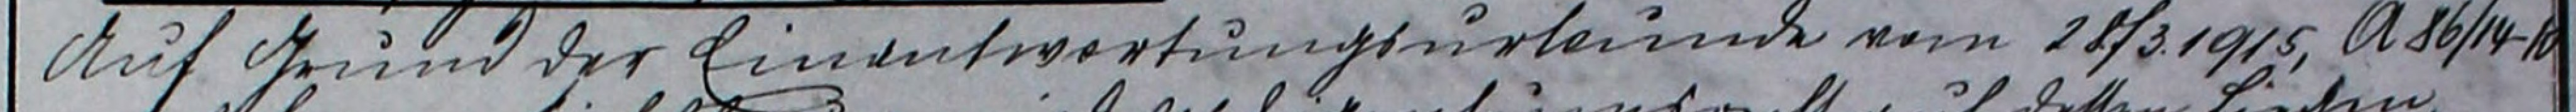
Auf Grund der Einantwortungsurkunde vom 28 f 3. 1915, A 86/14-10
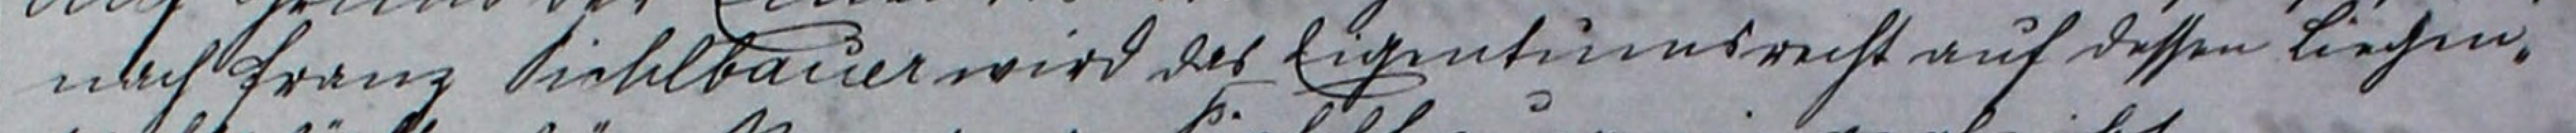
nach Franz Pichlbauer wird das Eigentumsrecht auf dessen Liechen„
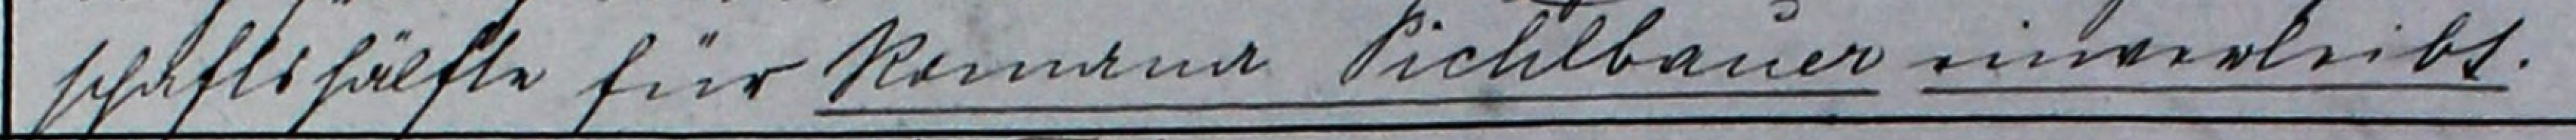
schaftshälfte für Romana Pichlbauer einverleibt.
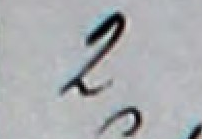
2
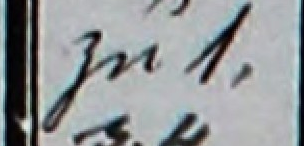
zu 1,
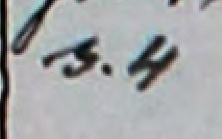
3. 4
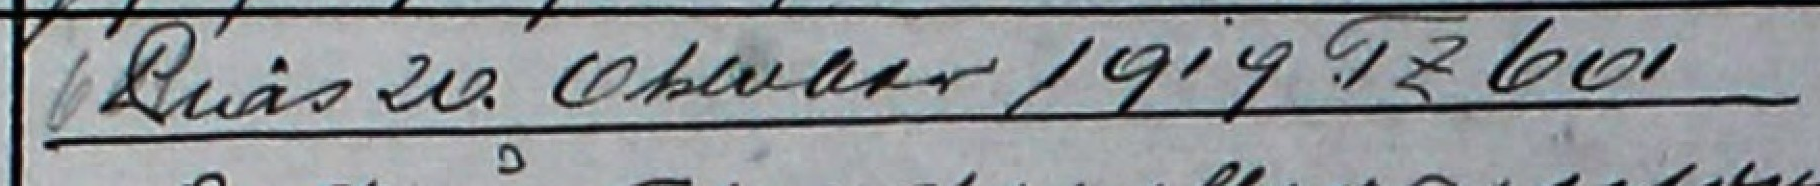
6 Präs 20. Oktober 1919 T Z 601
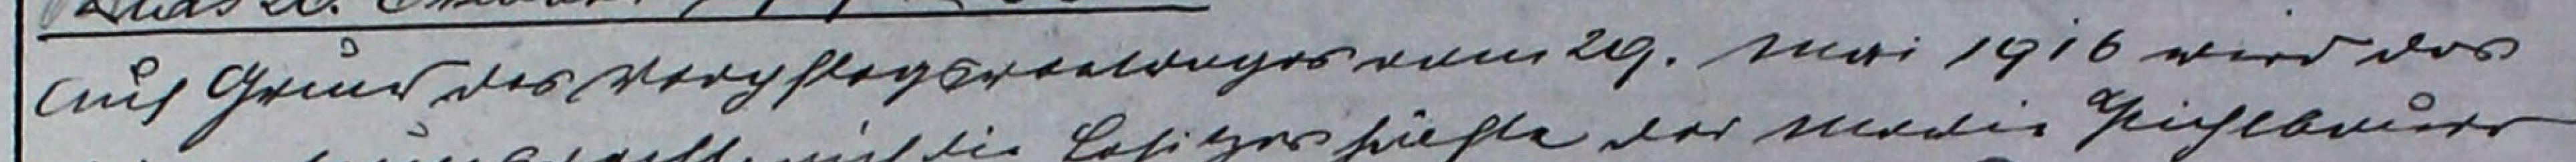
Auf Grund des Vergslagsrentrages vom 29. Mai 1916 wird das
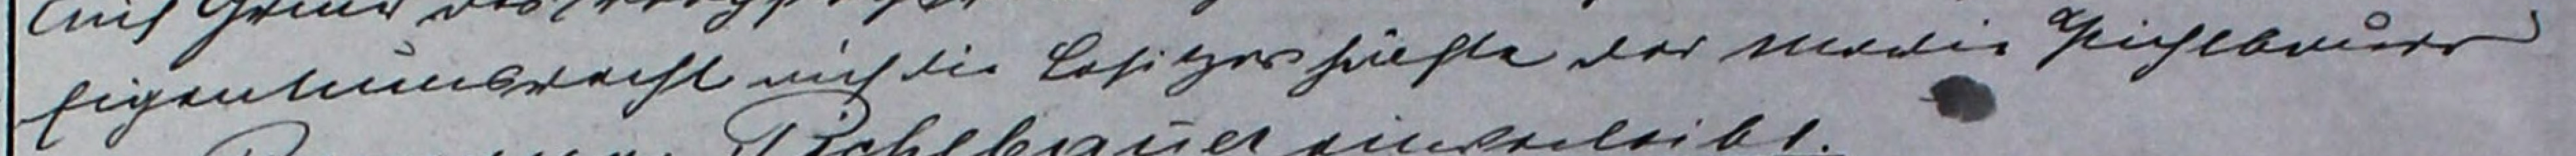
Eigentumsrecht nich ?ie lasitzes hälfte der ???ie Pichlbauer
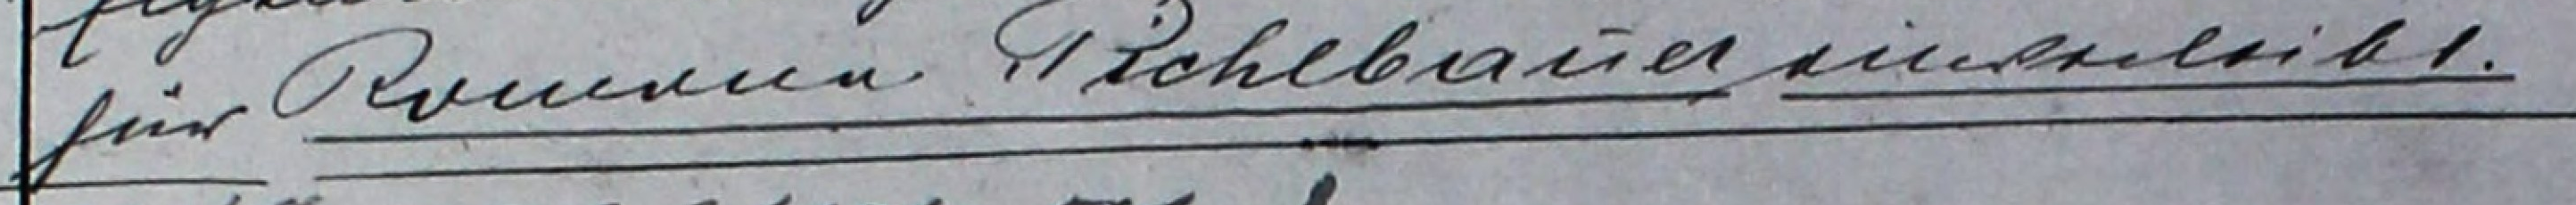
für Romana Pichlbauer einverleibt.
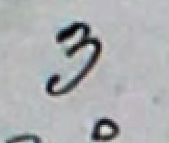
3
